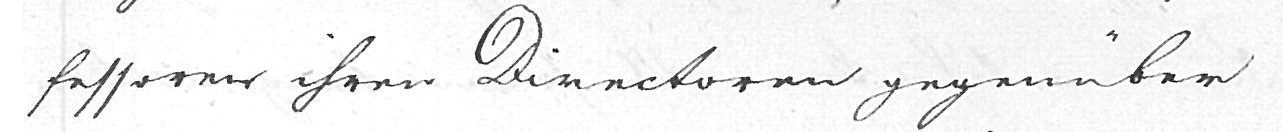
fessoren ihren Directoren gegenüber
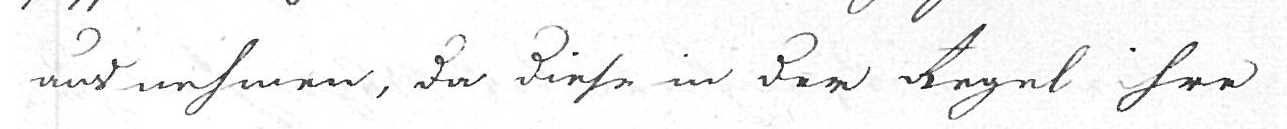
ausnehmen, da diese in der Regel ihre
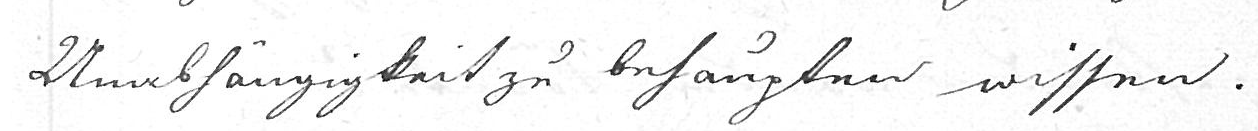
Unabhängigkeit zu behaupten wissen.
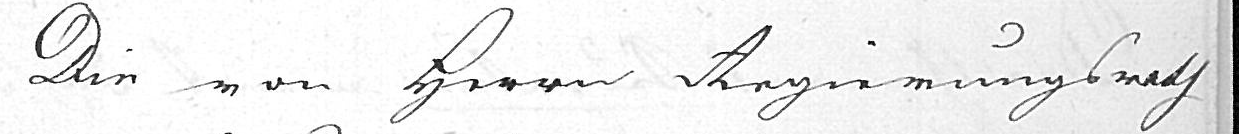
Die von Herrn Regierungsrath
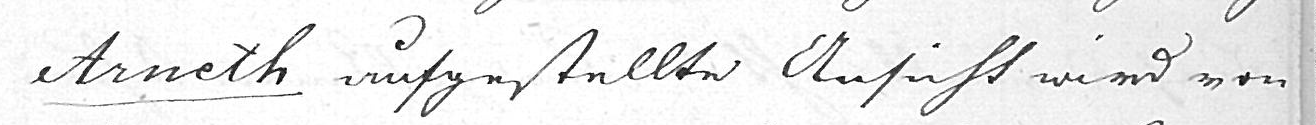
Arneth aufgestelle Ansicht wird von
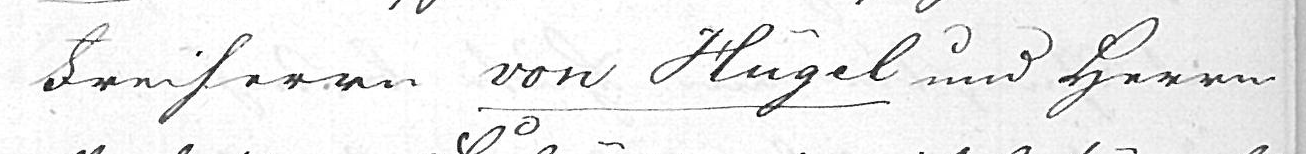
Freiherrn von Hügel und Herrn
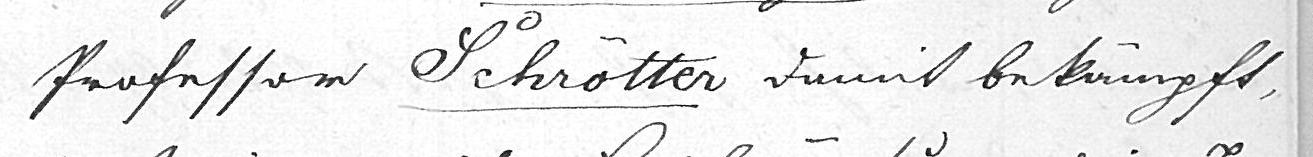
Professor Schrötter damit bekämpft,
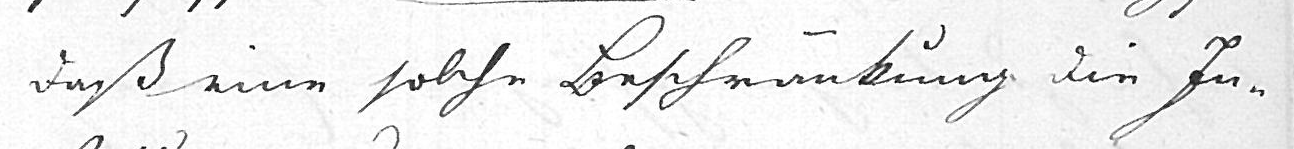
daß eine solche Beschränkung die In-
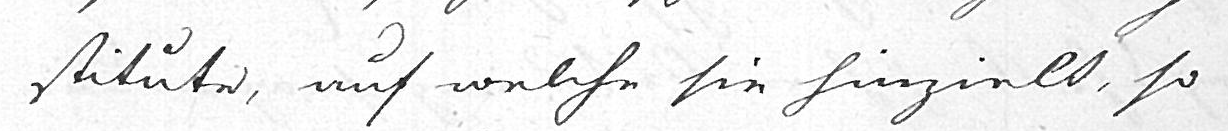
stitute, auf welche sie hinzielt, so
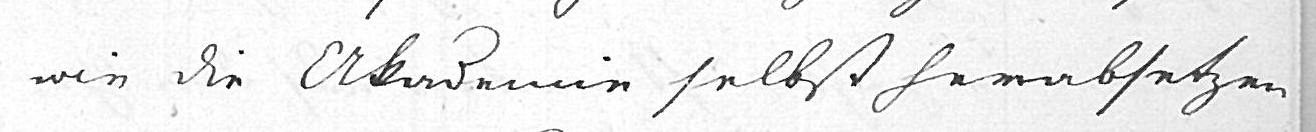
wie die Akademie selbst herabsetzen
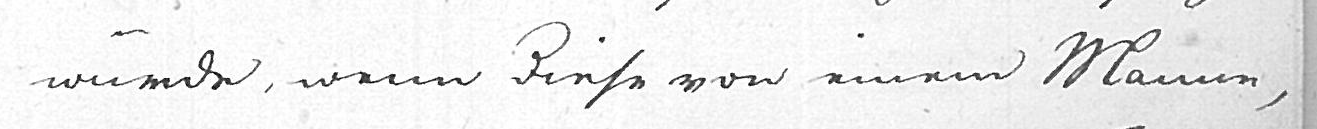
würde, wenn diese von einem Manne,
